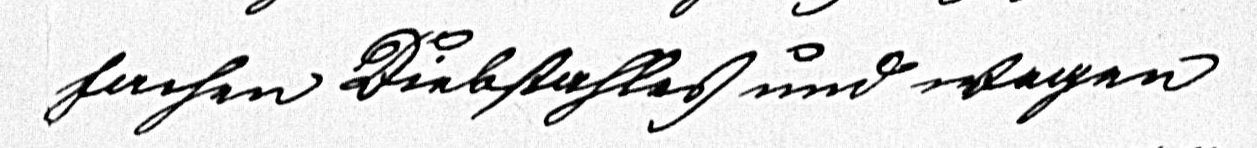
fachen Diebstahles und wegen
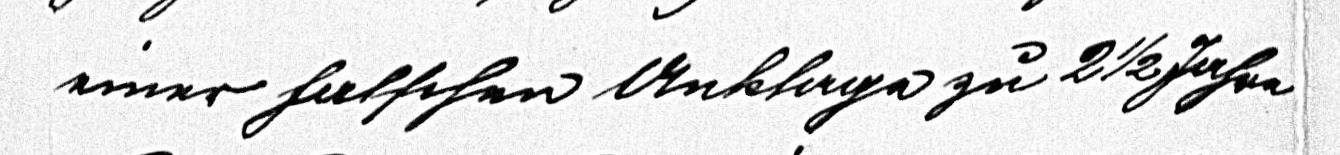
einer falschen Anklage zu 2 1/2 Jahre
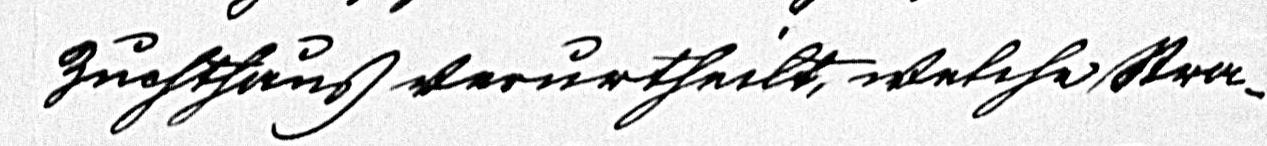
Zuchthaus verurtheilt, welche Stra¬
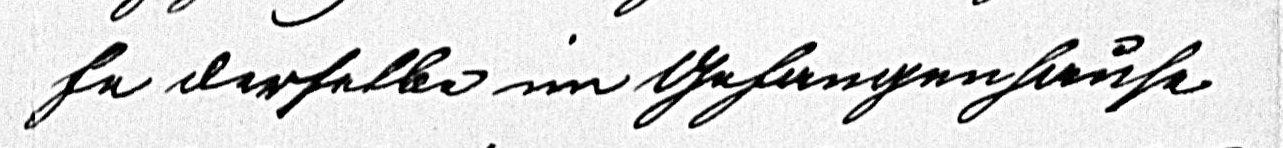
fe derselbe im Gefangenhause
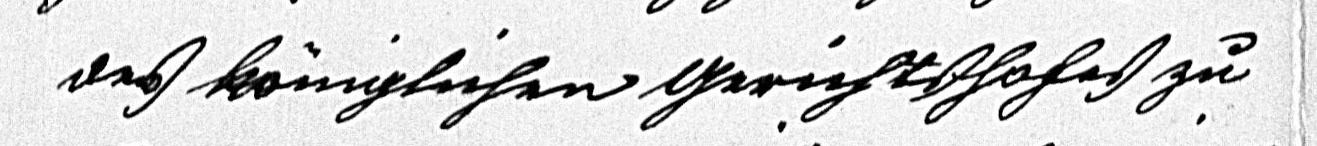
des königlichen Gerichtshofes zu
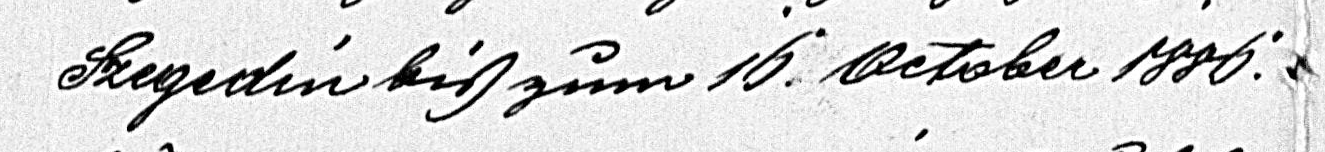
Szegedin bis zum 16. October 1886:
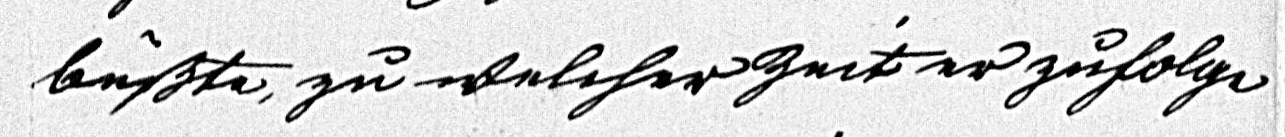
büßte, zu welcher Zeit er zufolge
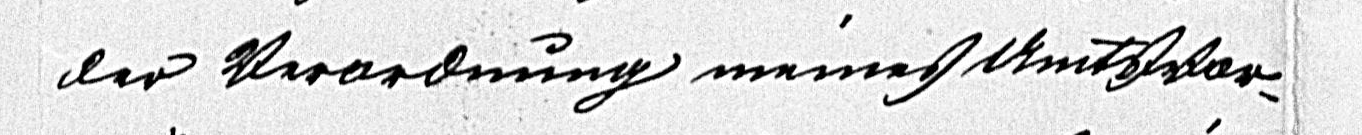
der Verordnung meines Amtsvor¬
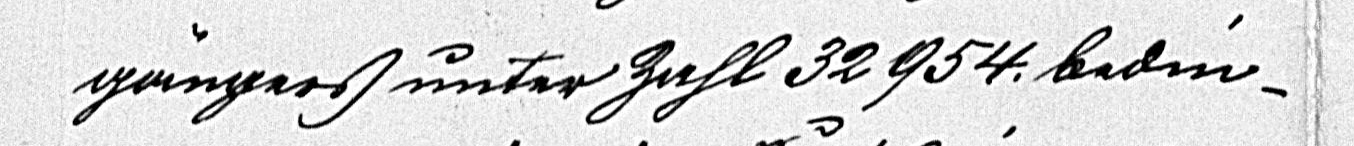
gängers unter Zahl 32954. bedin¬
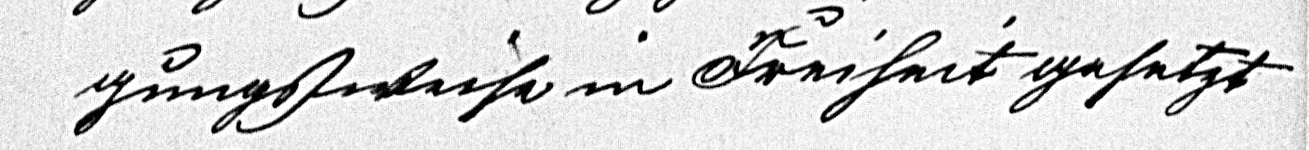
gungsweise in Freiheit gesetzt
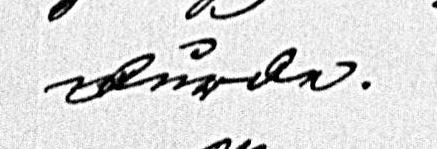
wurde.
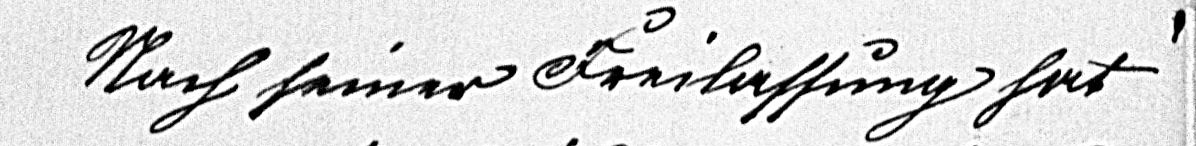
Nach seiner Freilassung hat
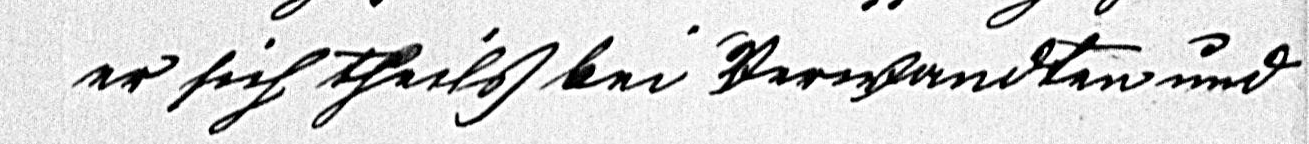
er sich theils bei Vorwandten und
